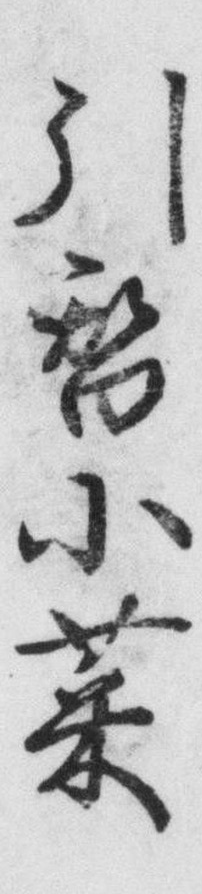引替小菜
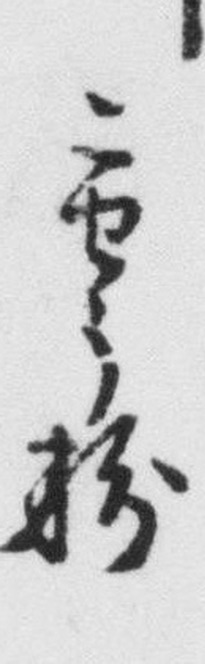こせう粉
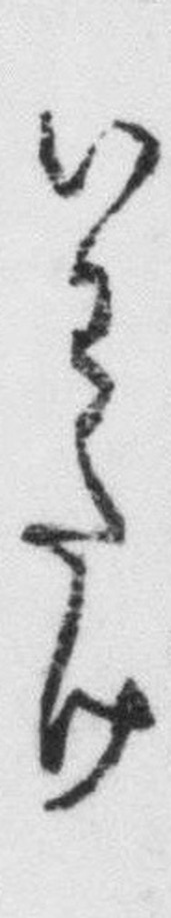いわたけ
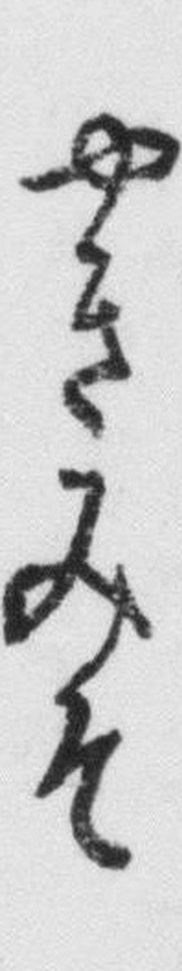やきみそ

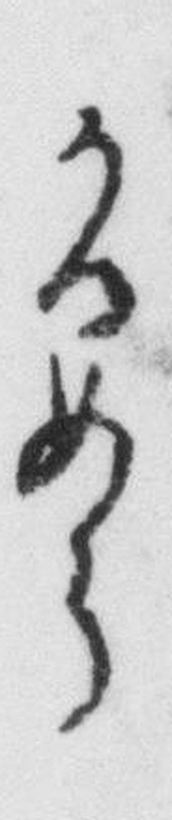からめら
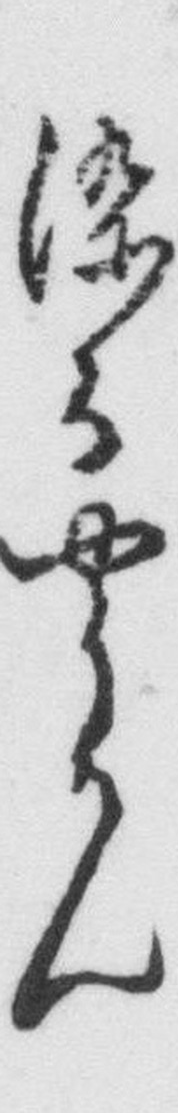染るやうかん
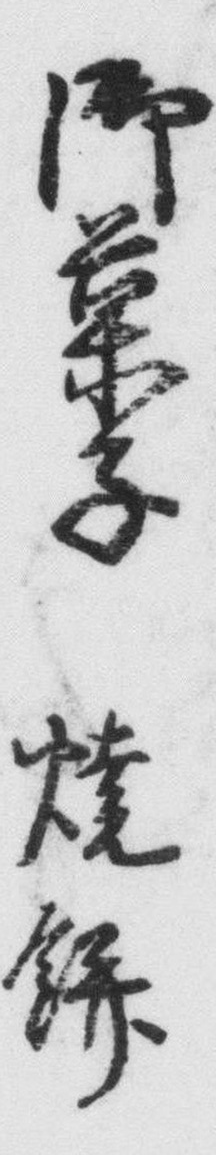御菓子焼餅
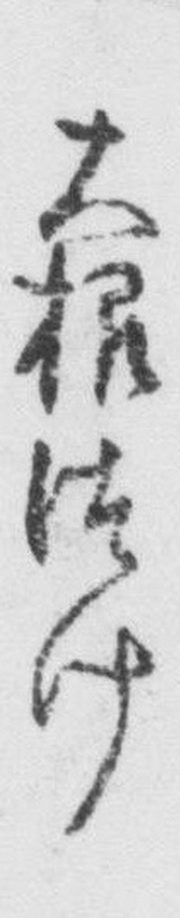大根徒け

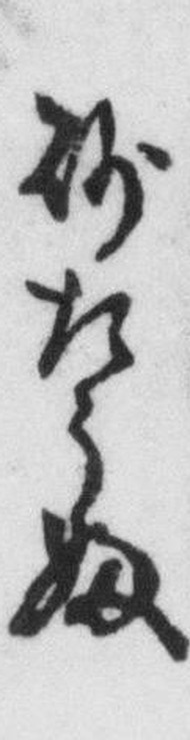砂たう婦
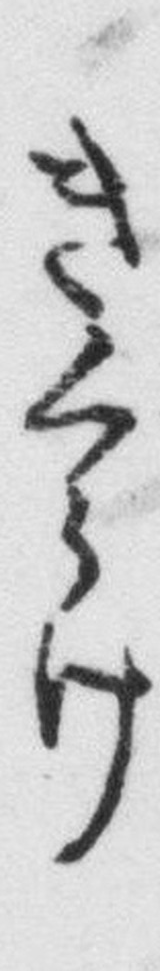きくらけ
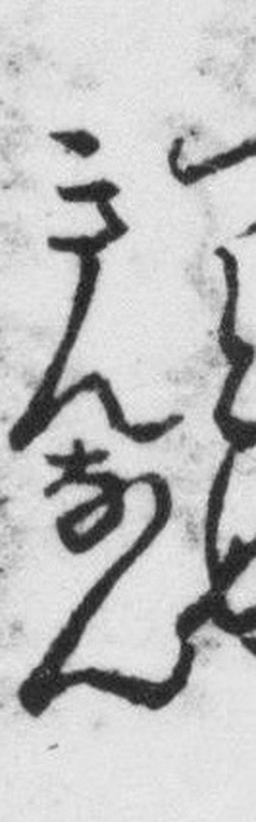きんなん

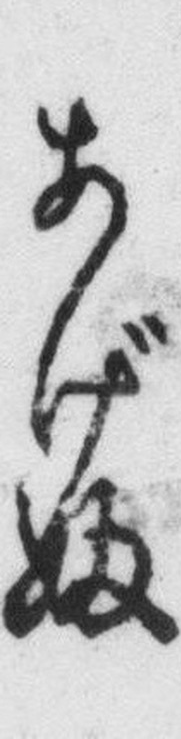あげ麩
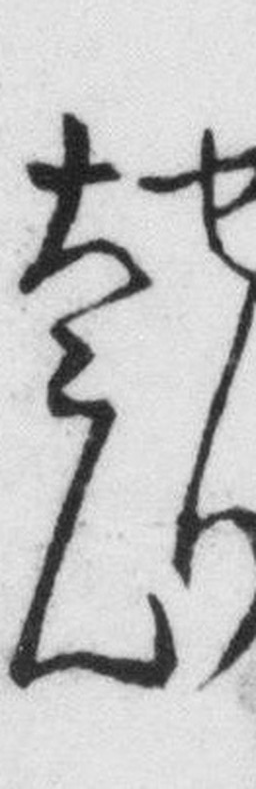大こん
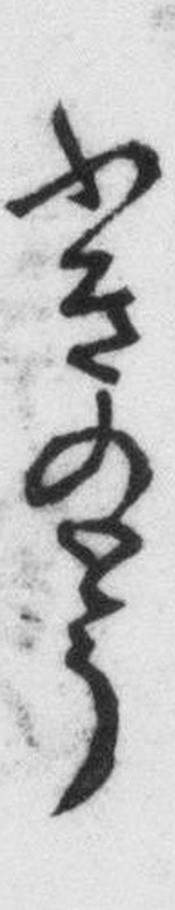ふきのとう
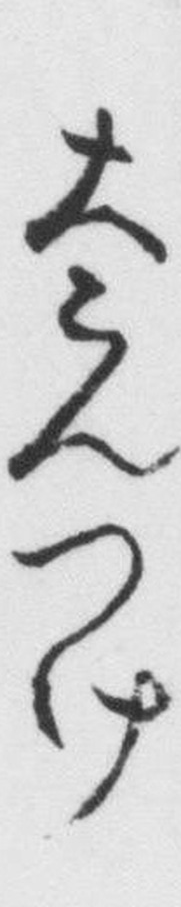大こんつけ
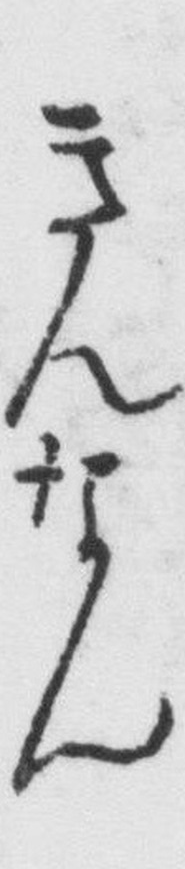きんなん
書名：普茶料理抄
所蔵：大阪府立大学学術情報センター 国文学研究資料館
